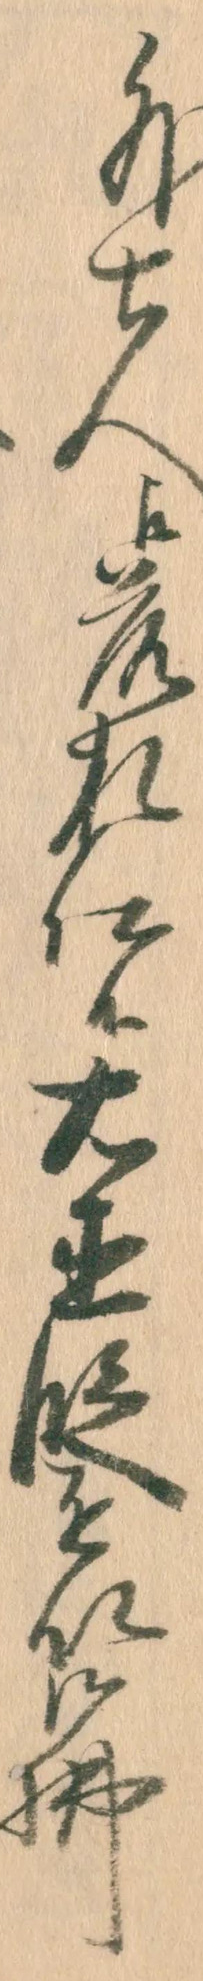外七人え落札仕候右直段を以御払
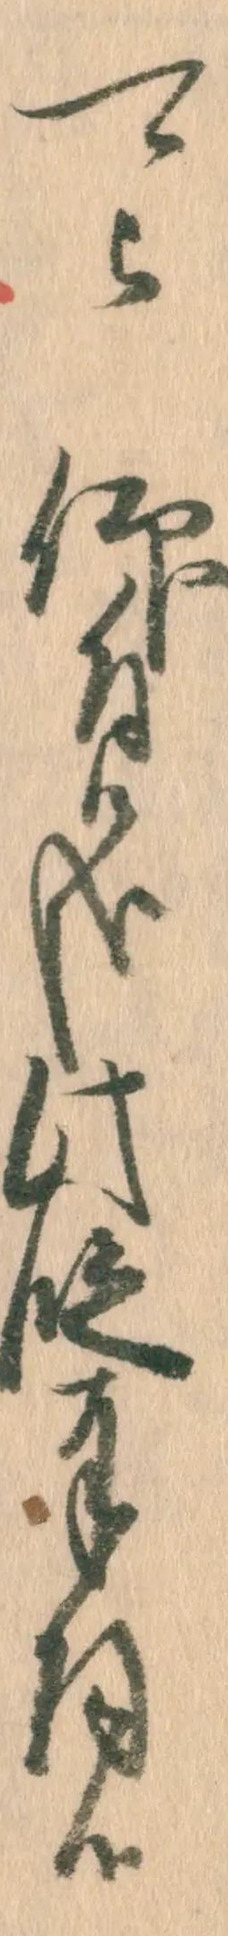可被仰付候哉此段奉伺候
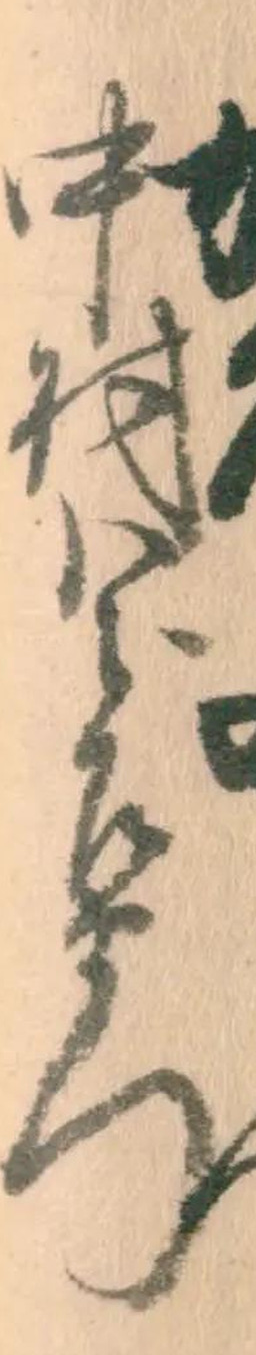中村八郎左衛門
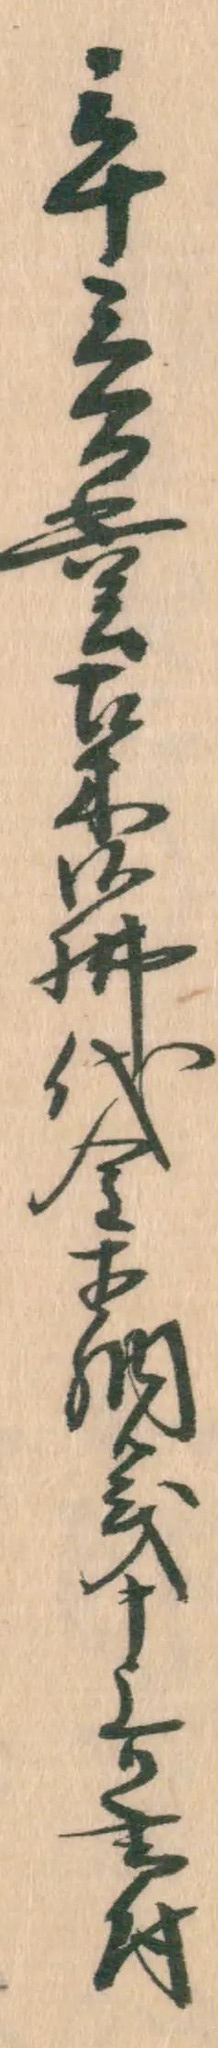「三十三間堂古木御払代金相納候義申上候書付
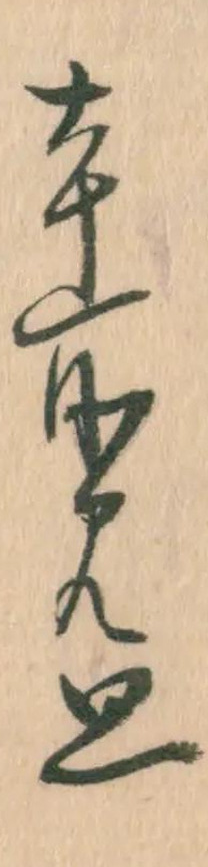本所見廻」
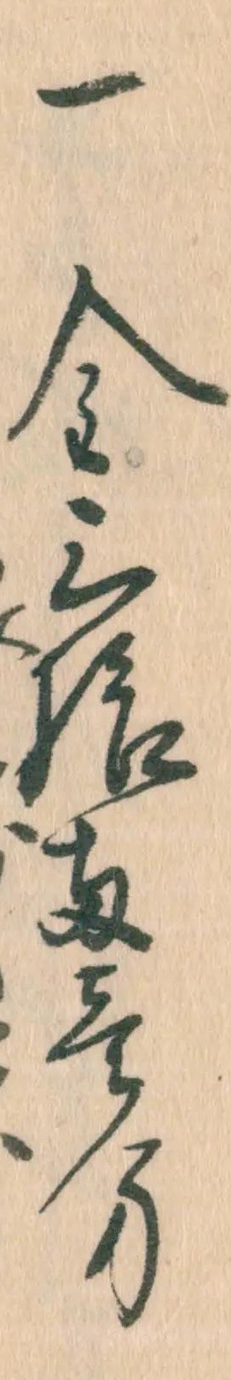一金三拾両壱分
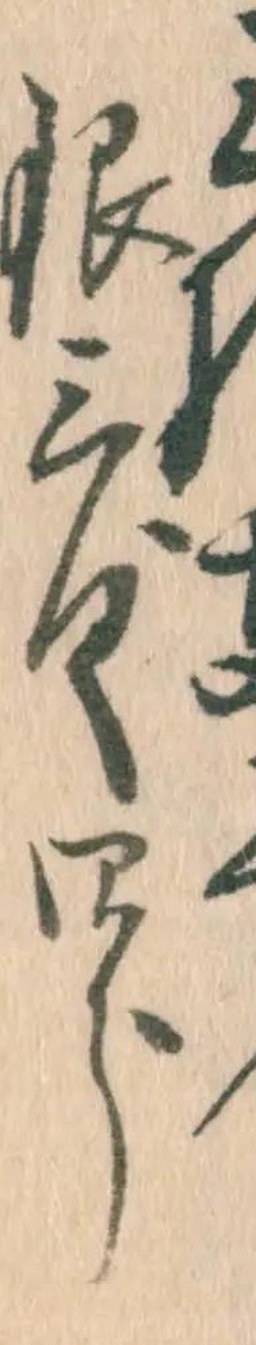銀三匁四分
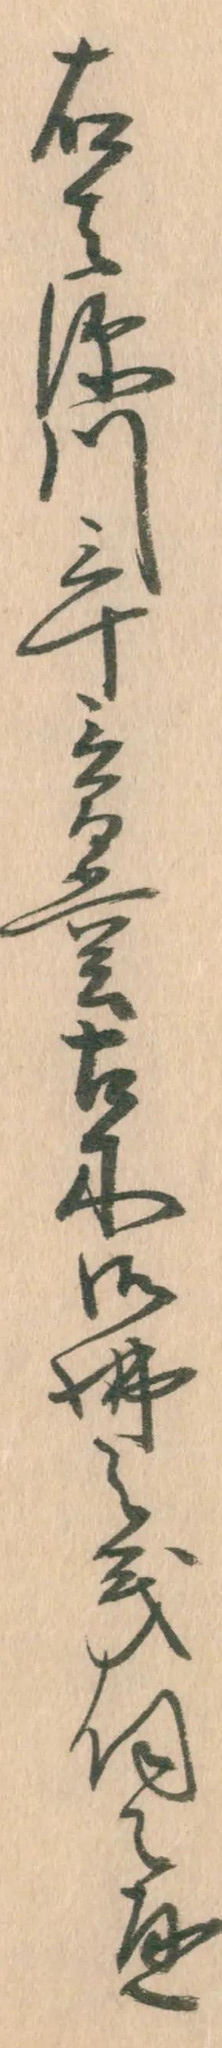右は深川三十三間堂古木御払之義伺之通

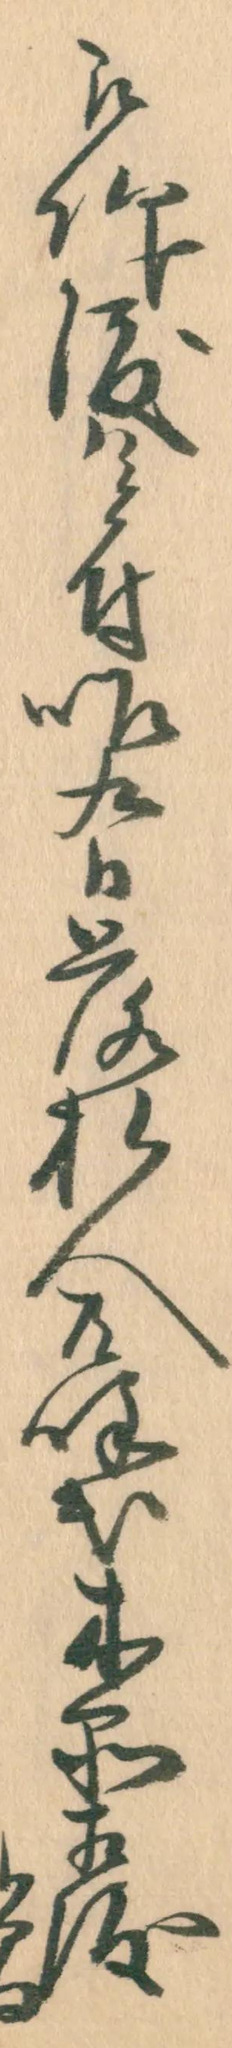被仰渡候ニ付昨九日落札人共呼出木品相渡候間
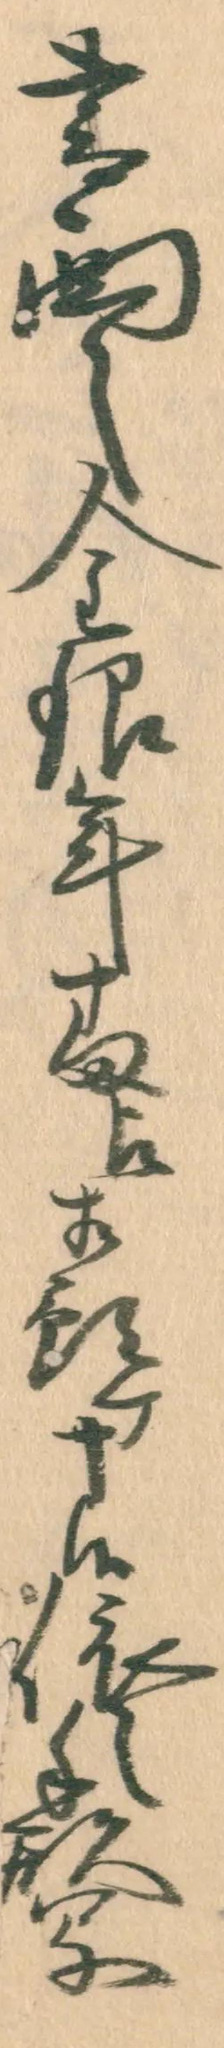書面之金銀年番え相預ケ申候依之手形写
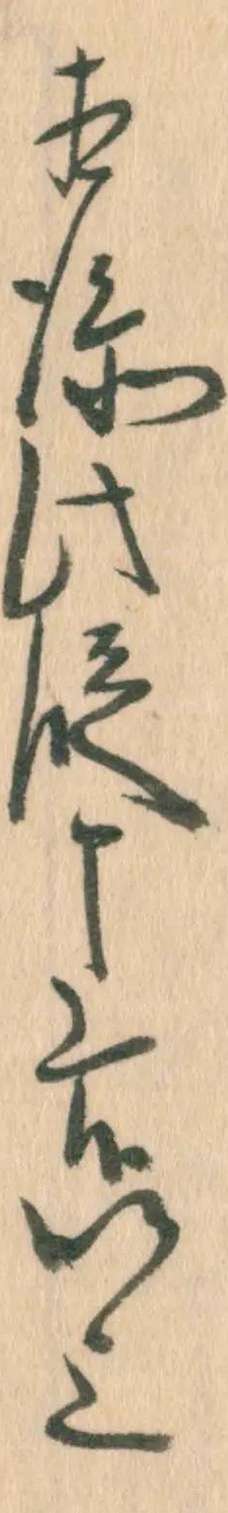相添此段申上候以上
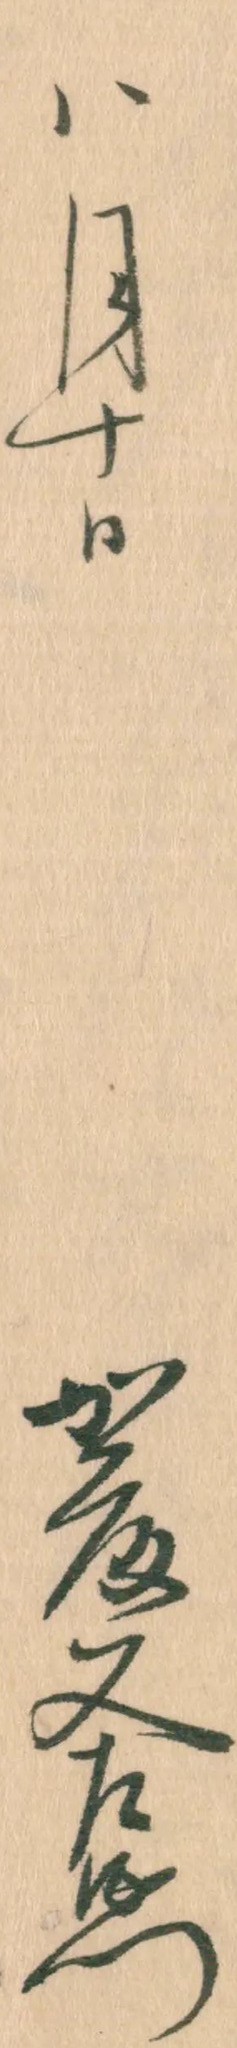八月十日加藤又左衛門
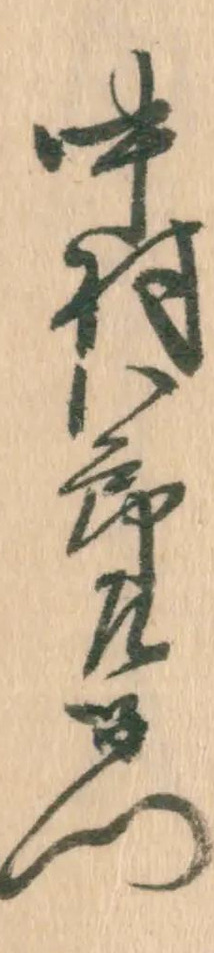中村八郎左衛門
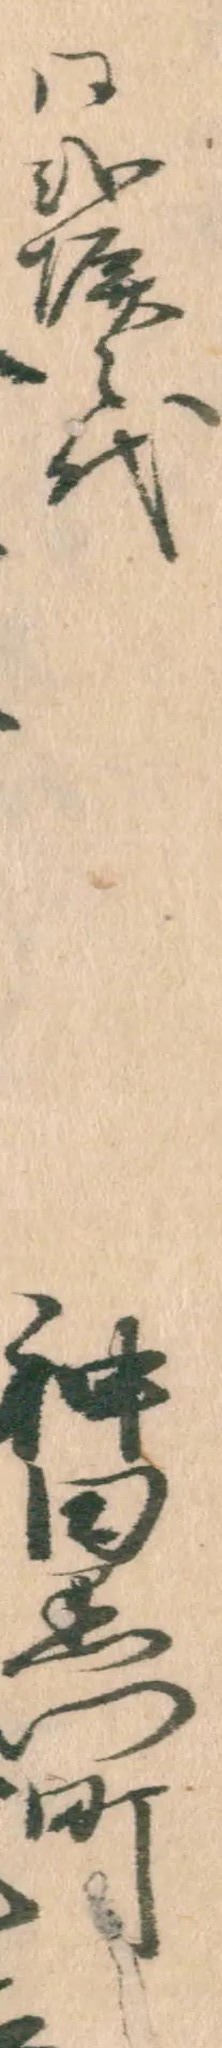同弐塀之代神田黒門町
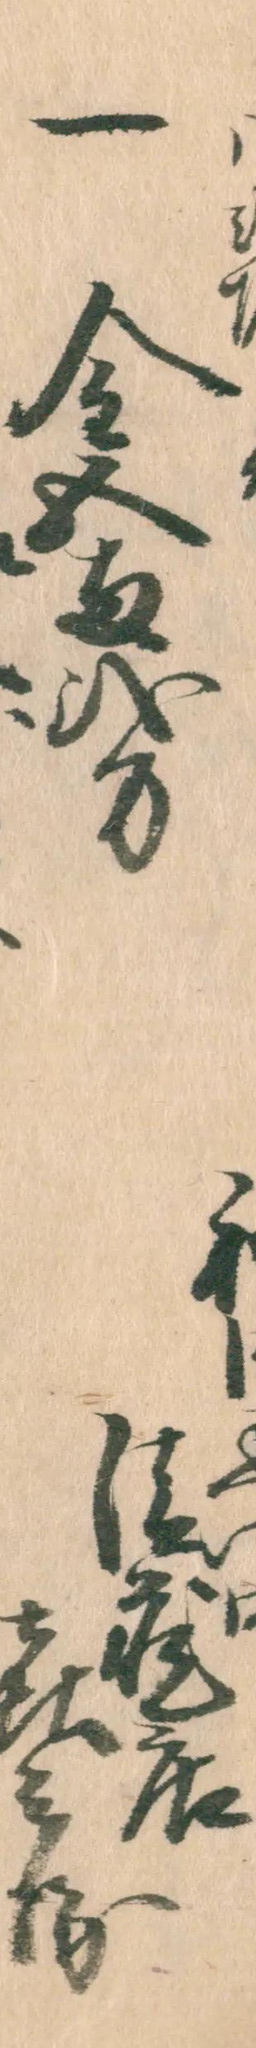一金五両弐分清蔵店

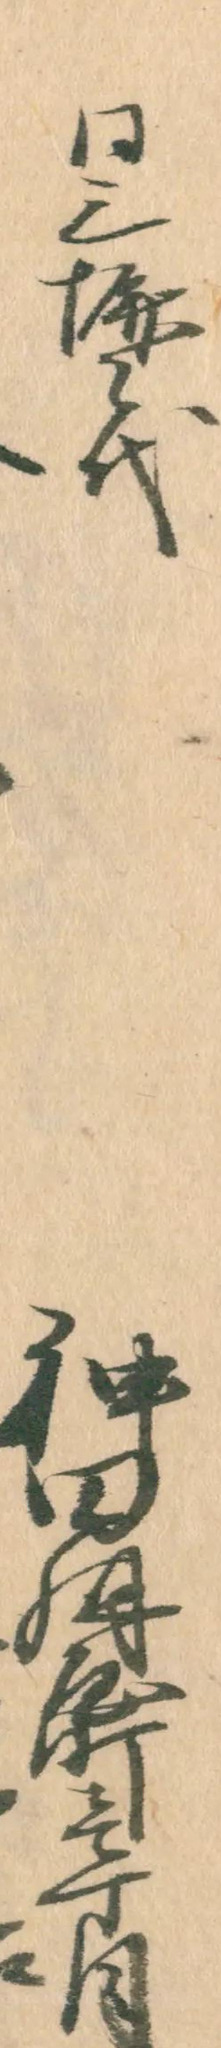同三塀之代神田紺屋町壱丁目
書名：三十三間堂. [2]
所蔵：国立国会図書館 National Diet Library, JAPAN
